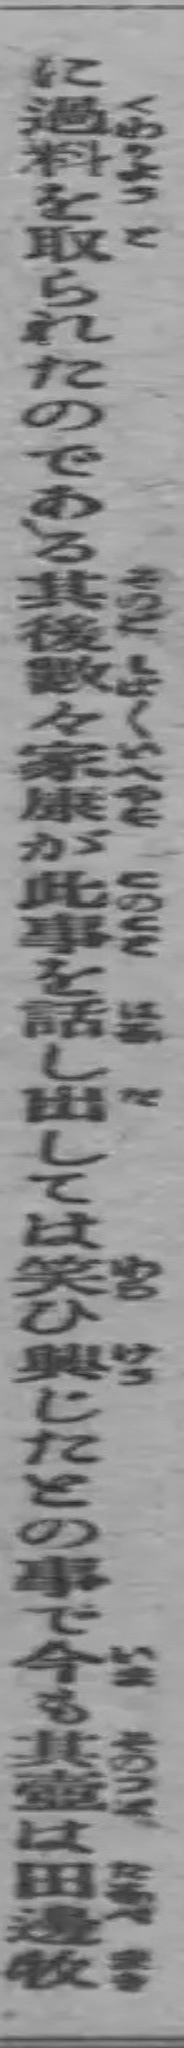に過料を取られたのである其後数々家康が此事を話し出しては笑ひ興じたとの事で今も其壷は田邉牧
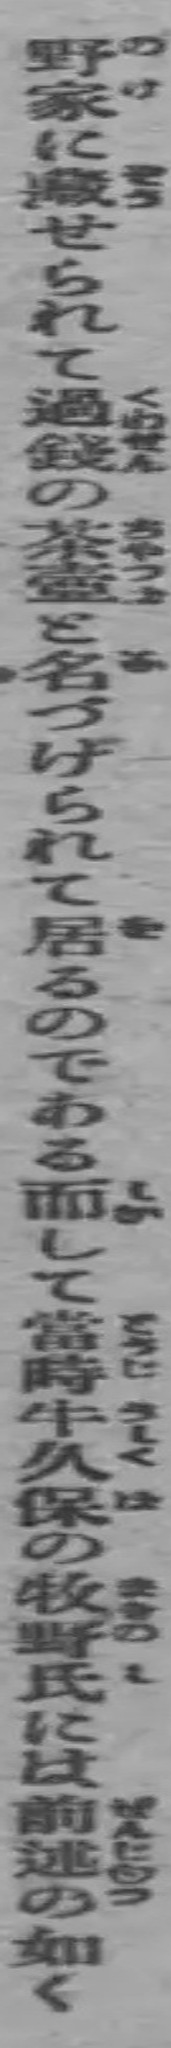野家に蔵せられて過銭の茶壷と名づけられて居るのである而して当時牛久保の牧野氏には前述の如く
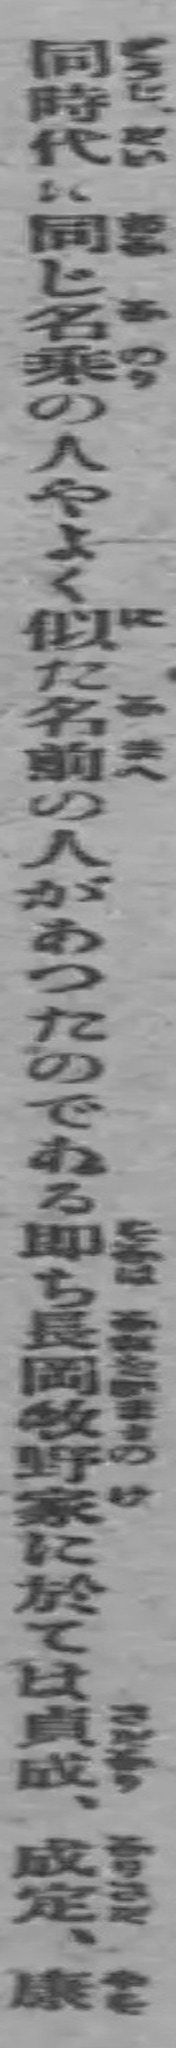同時代に同じ名乗の人やよく似た名前の人があつたのである即ち長岡牧野家に於ては貞成、成定、康
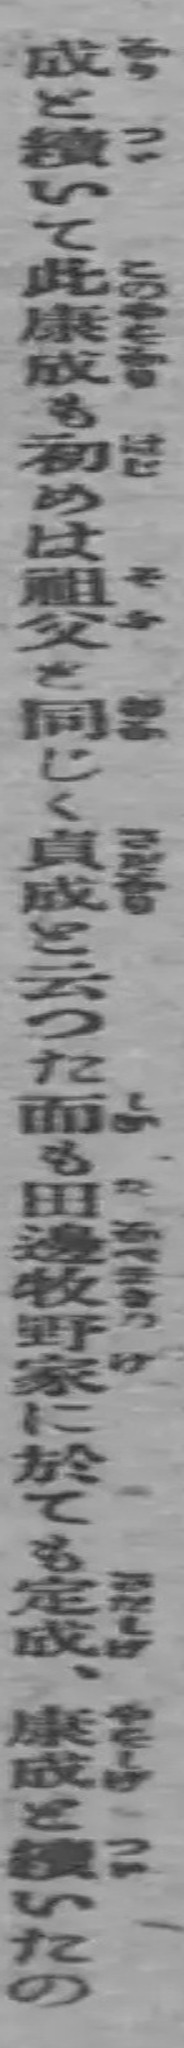成と続いて此康成も初めは祖父と同じく貞成と云つた而も田邉牧野家に於ても定成、康成と続いたの
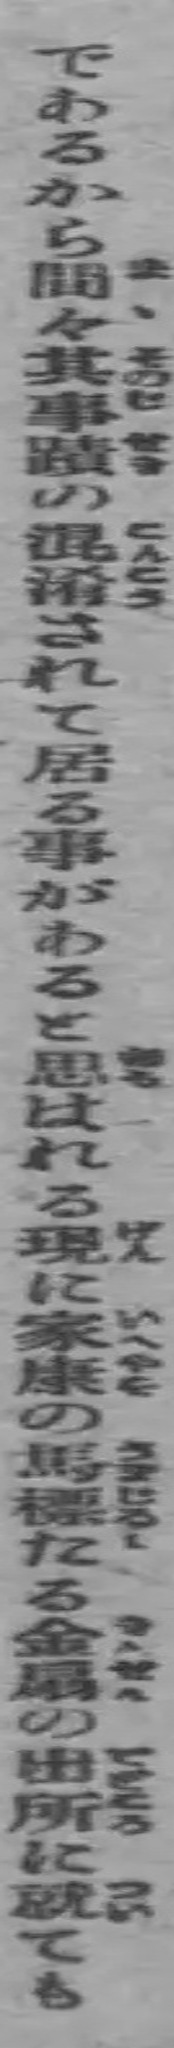金扇馬標であるから間々その事蹟の混淆されて居る事があると思はれる現に家康の馬標たる金扇の出所に就ても
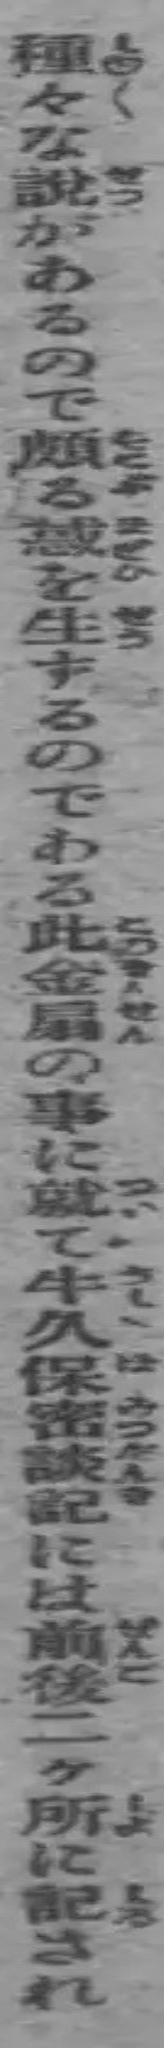種々な説があるので頗る惑を生ずるのである此金扇の事に就て牛久保密談記には前後二ケ所に記され
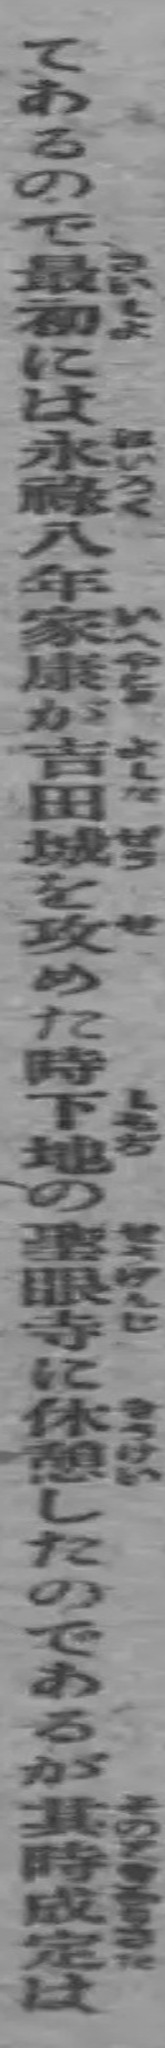てあるので最初には永禄八年家康が吉田城を攻めた時下地の聖眼寺に休憩したのであるが其時成定は
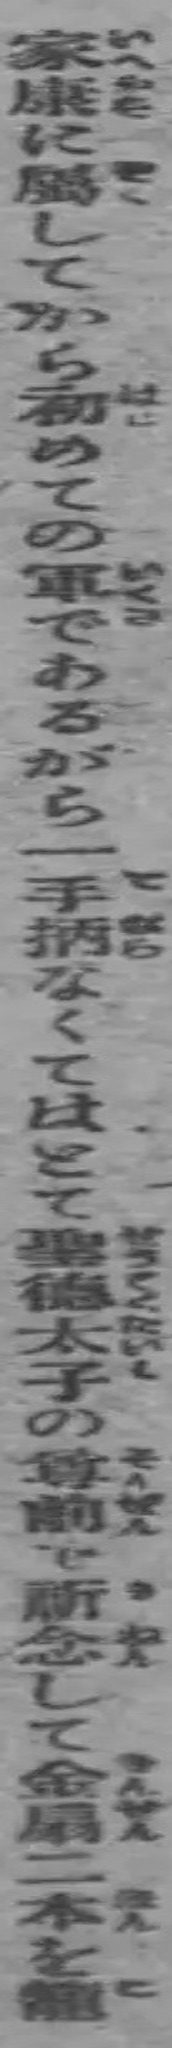家康に属してから初めての軍であるから一手抦なくてはとて聖徳太子の尊前で祈念して金扇二本を籠
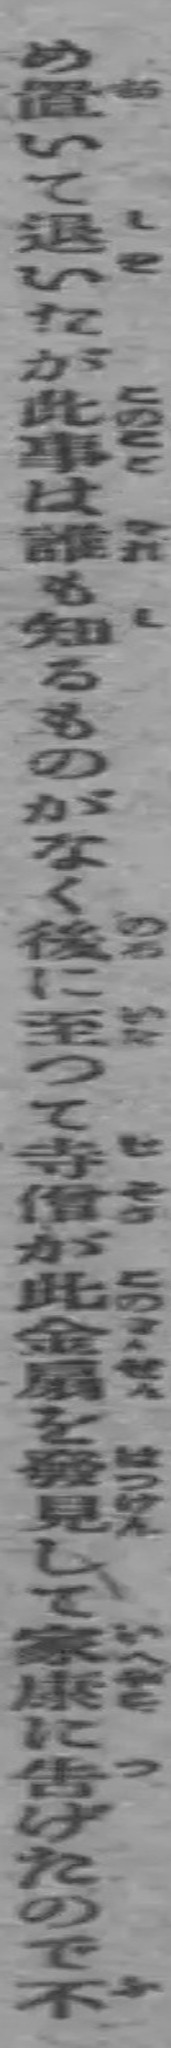め置いて退いたが此事は誰も知るものがなく後に至つて寺僧が此金扇を発見して家康に告げたので不
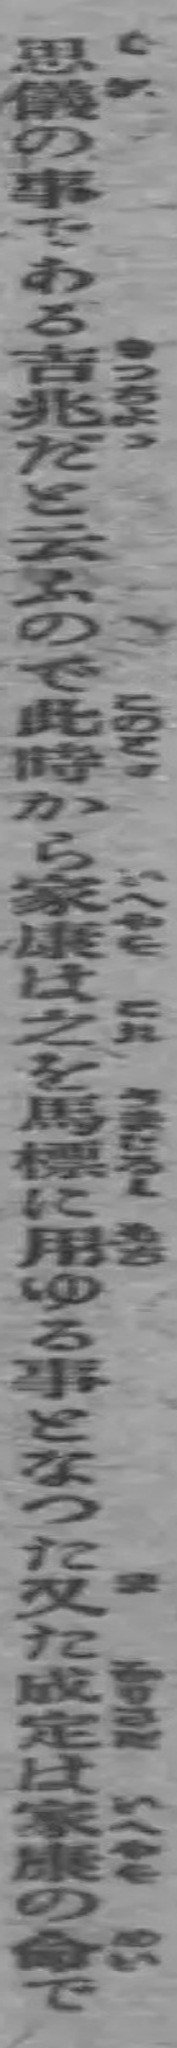思儀の事である吉兆だと云ふので此時から家康は之を馬標に用ゆる事となつた又た成定は家康の命で
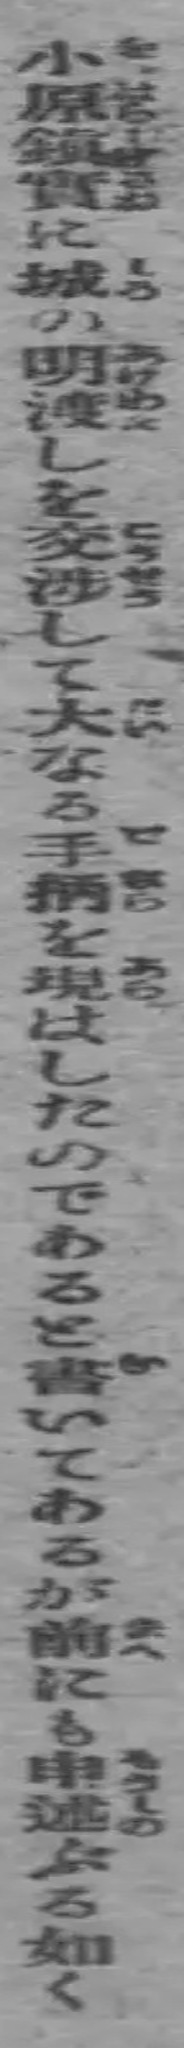小原鎮実に城の明渡しを交渉して大なる手抦を現はしたのであると書いてあるが前にも申述ぶる如く
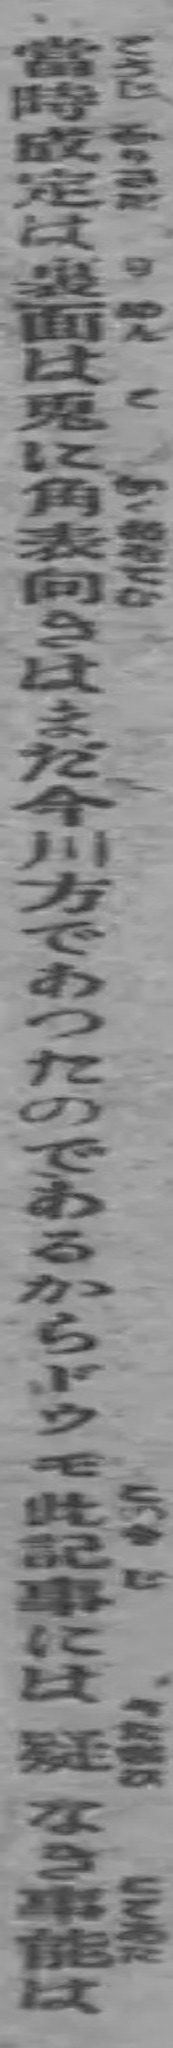当時成定は裏面は兎に角表向きはまだ今川方であつたのであるからドウモ此記事には疑なき事能は
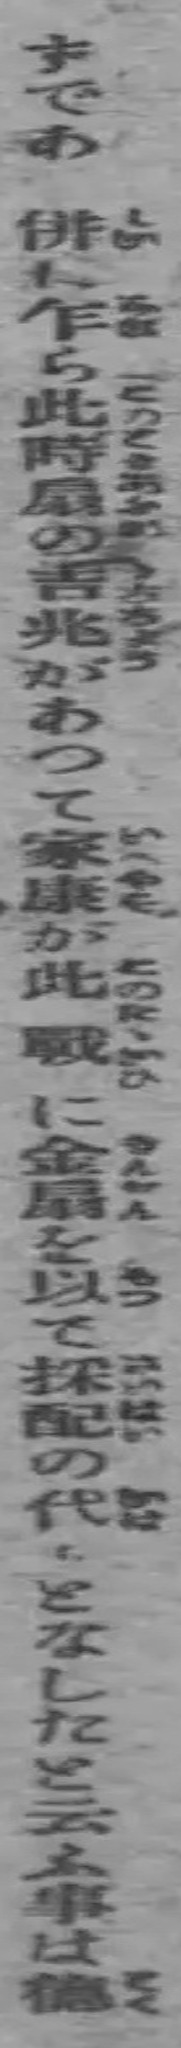ずであ併し乍ら此時扇の吉兆があつて家康が此戦に金扇を以て採配の代りとなしたと云ふ事は徳
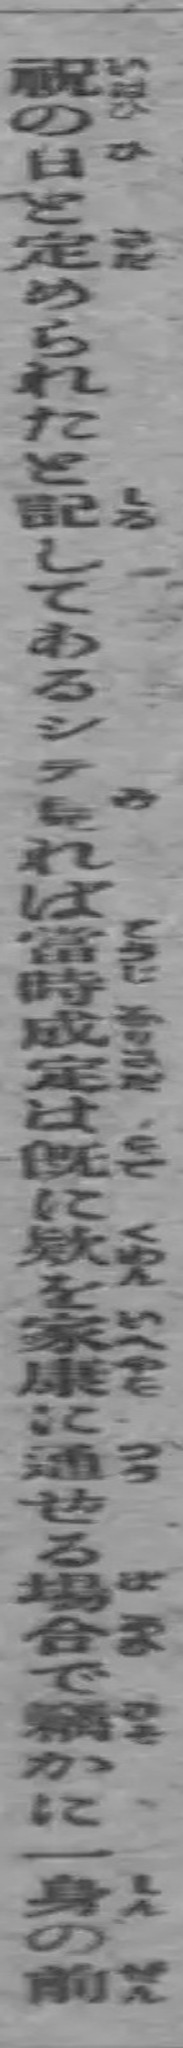祝の日と定められたと記してあるシテ見れば当時成定は既に欵を家康に通ぜる場合で竊かに一身の前
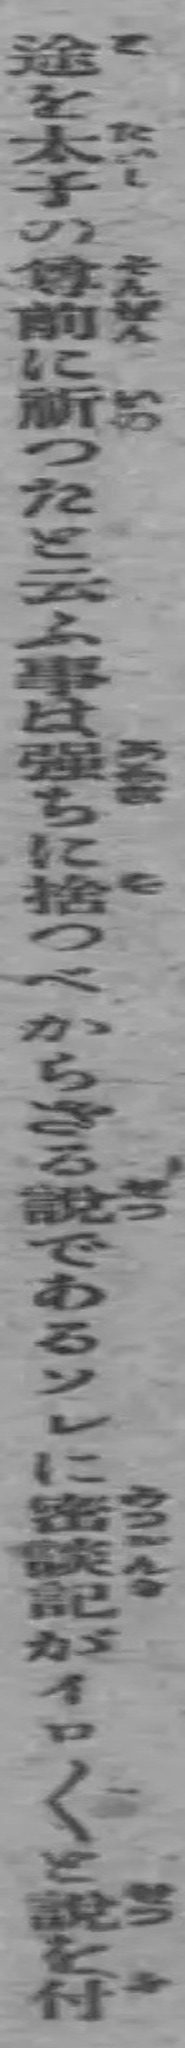途を太子の尊前に祈つたと云うふ事は強ちに捨つべからざる説であるソレに密談記がイロ〳〵と説を付
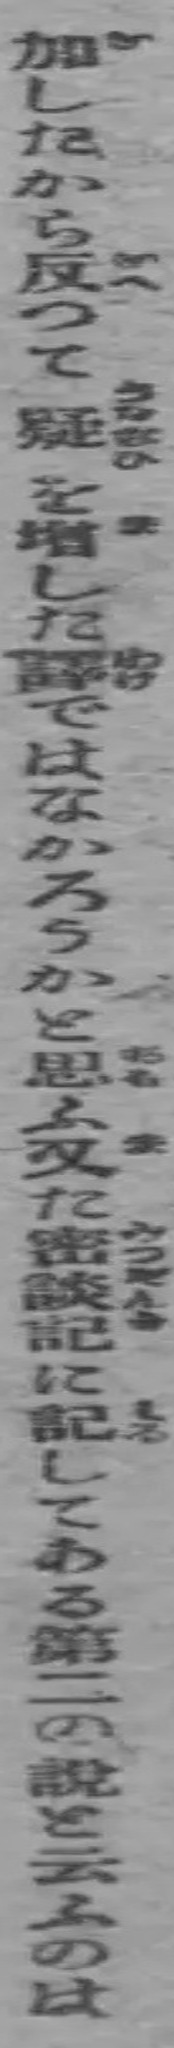加したから反つて疑を増した訳ではなかろうかと思ふ又た密談記に記してある第二の説と云ふのは
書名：豊橋市史談
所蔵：国立国会図書館 National Diet Library, JAPAN
